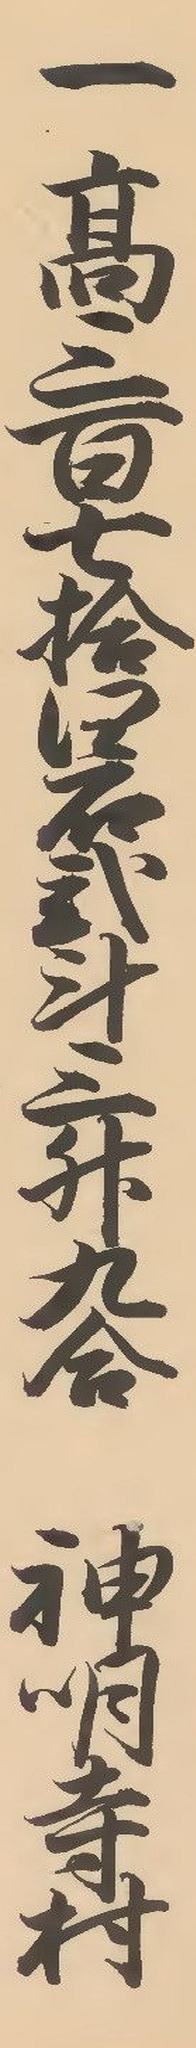一髙三百七拾四石弐斗三升九合神明寺村
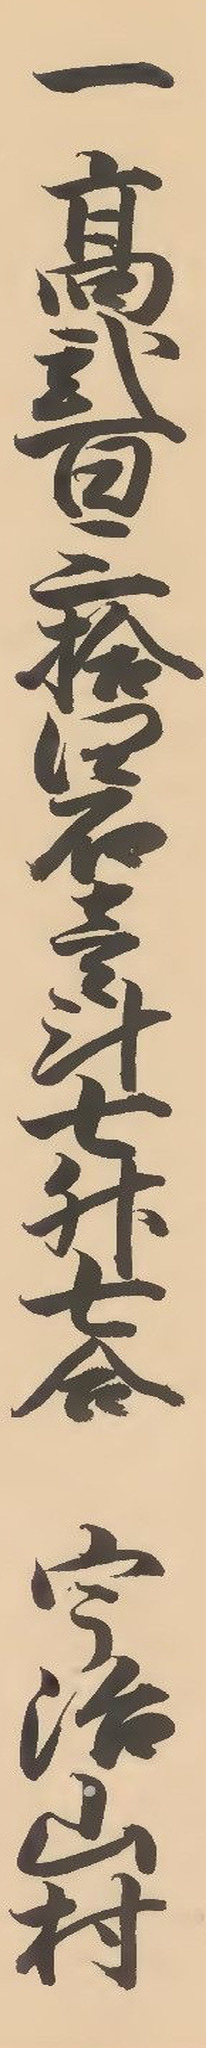一髙弐百三拾四石壱斗七升七合宇治山村
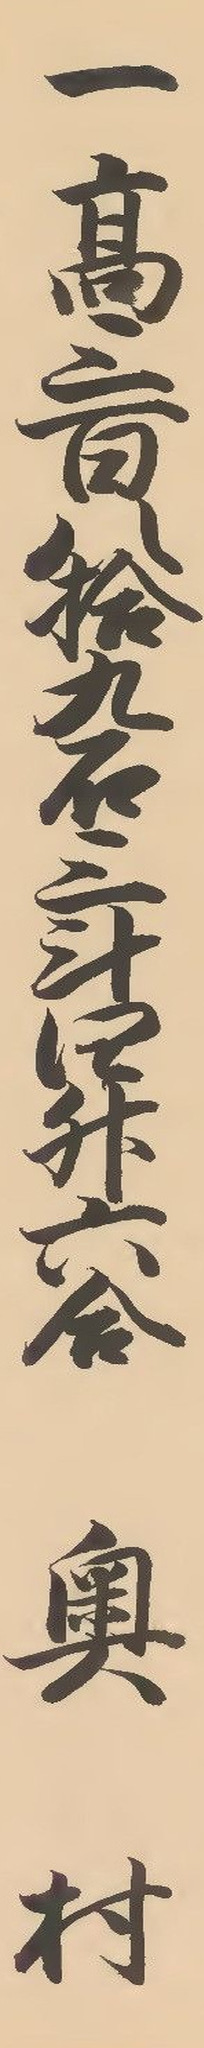一髙三百八拾九石三斗四升六合奥村
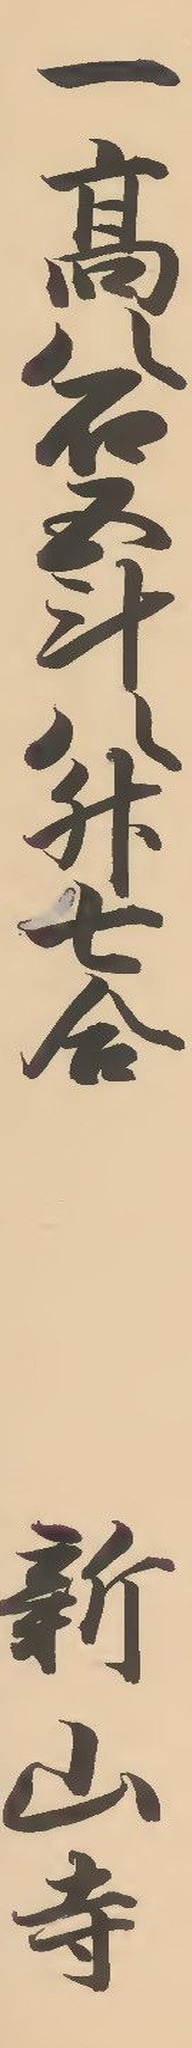一髙八石五斗八升七合新山寺
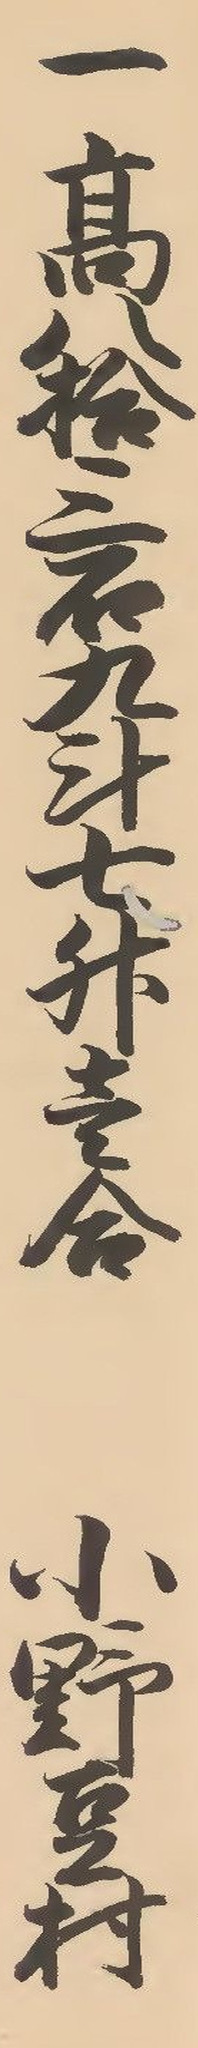一髙八拾三石九斗七升壱合小野豆村
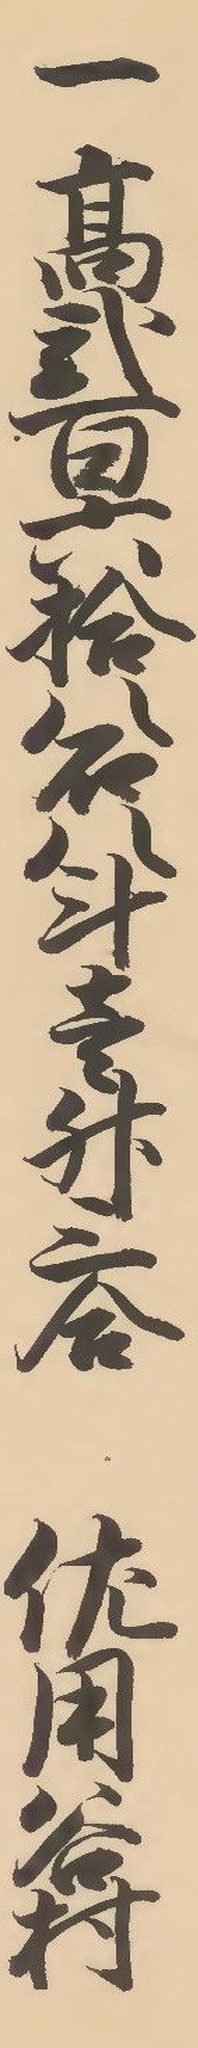一髙弐百六拾八石八斗壱升三合作用谷村
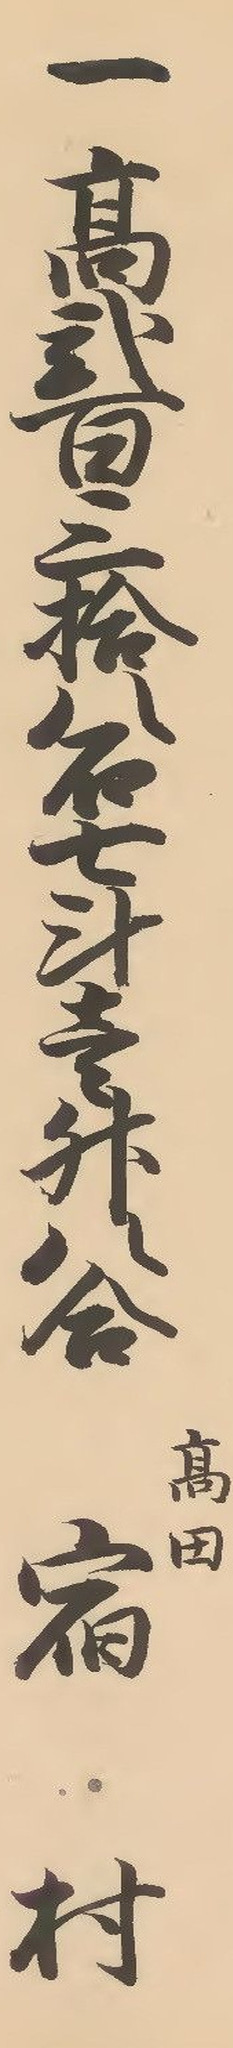一髙弐百三拾八石七斗壱升八合宿村
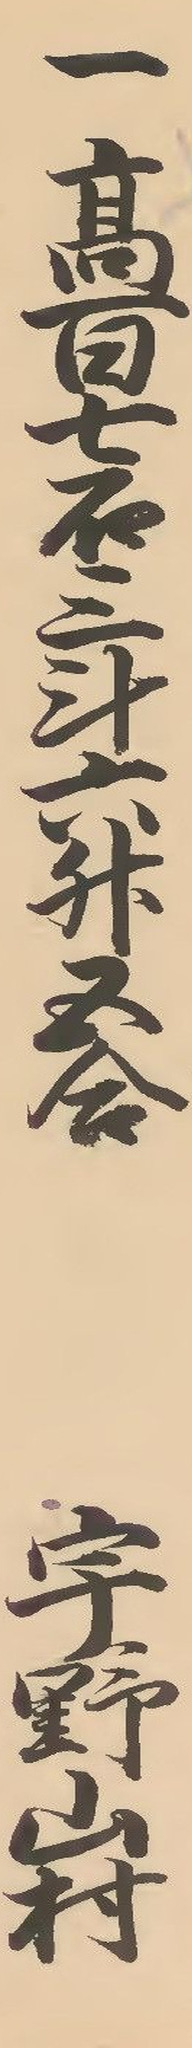一髙百七石三斗六升五合宇野山村

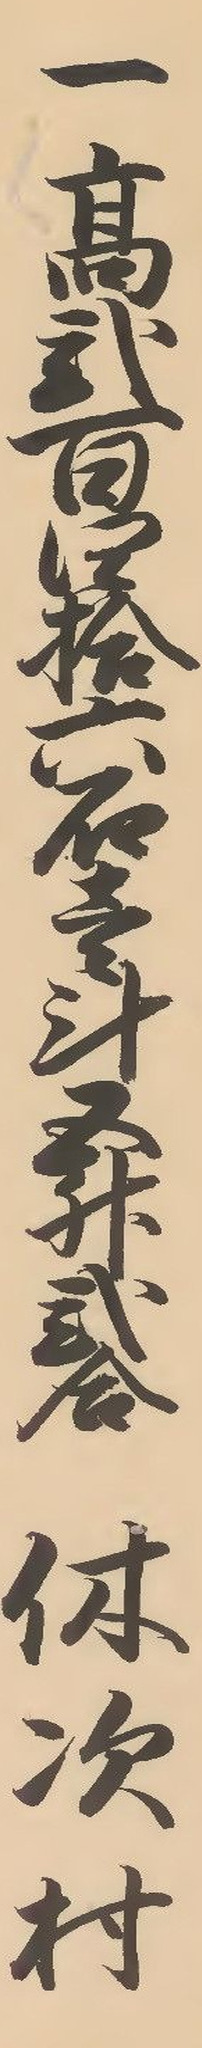一髙弐百四拾六石壱斗五升弐合休次村
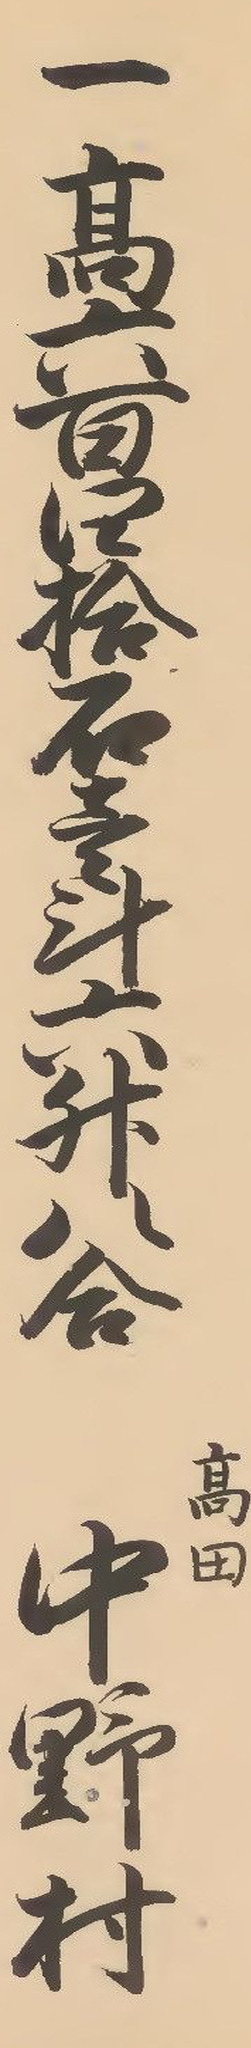一髙六百四拾石壱斗六升八合中野村
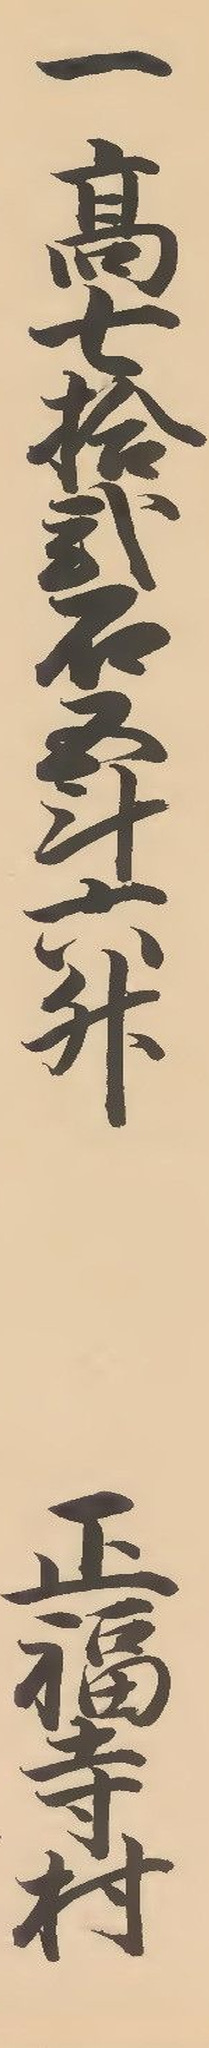一髙七拾弐石五斗六升正福寺村
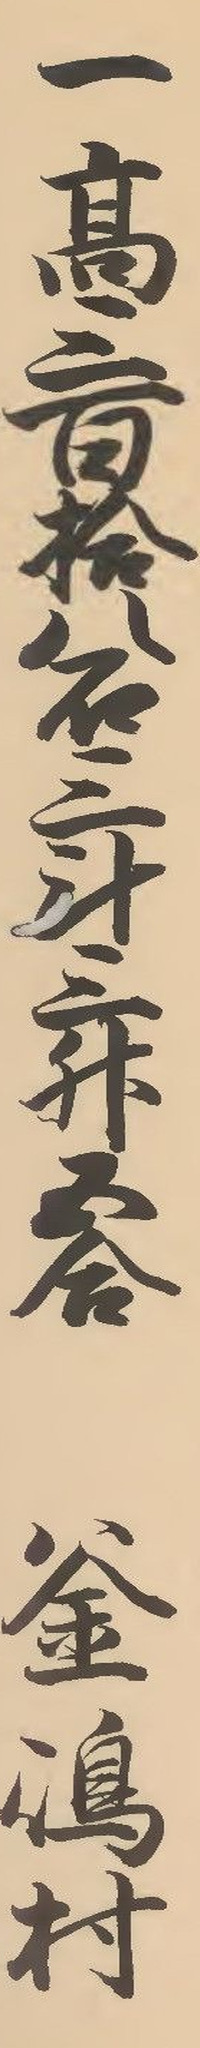一髙三百拾八石三斗三升五合釜嶋村
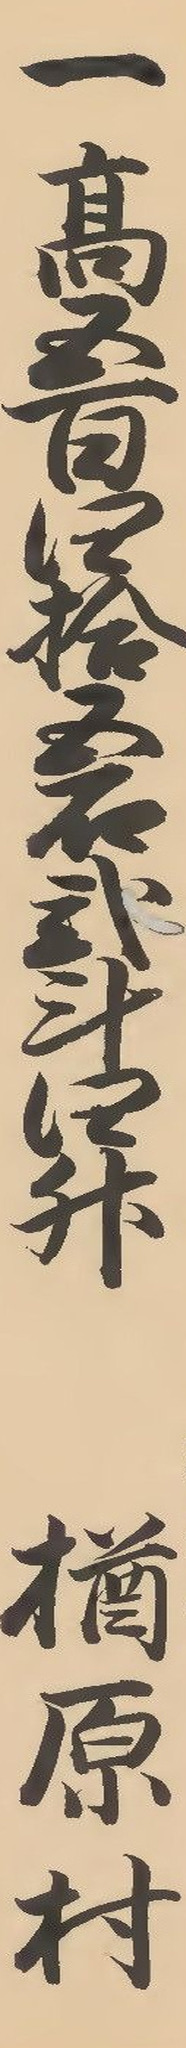一髙五百四拾五石弐斗四升楢原村
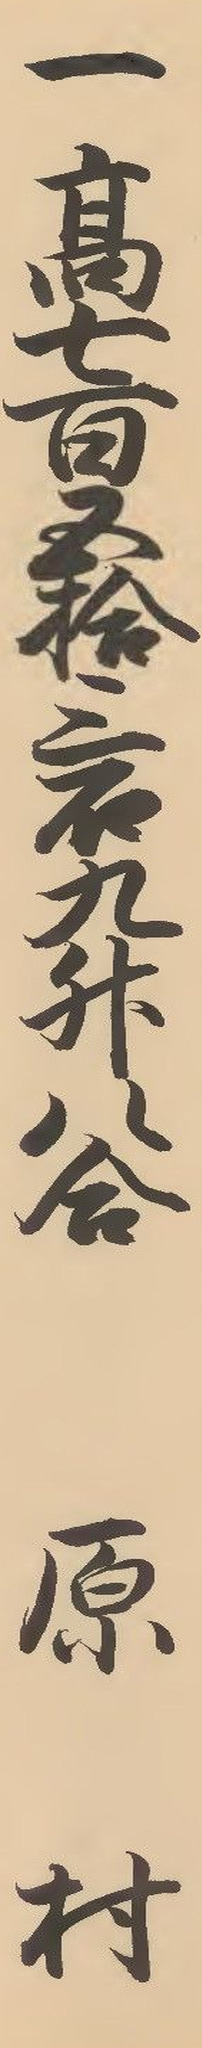一髙七百五拾三石九升八合原村
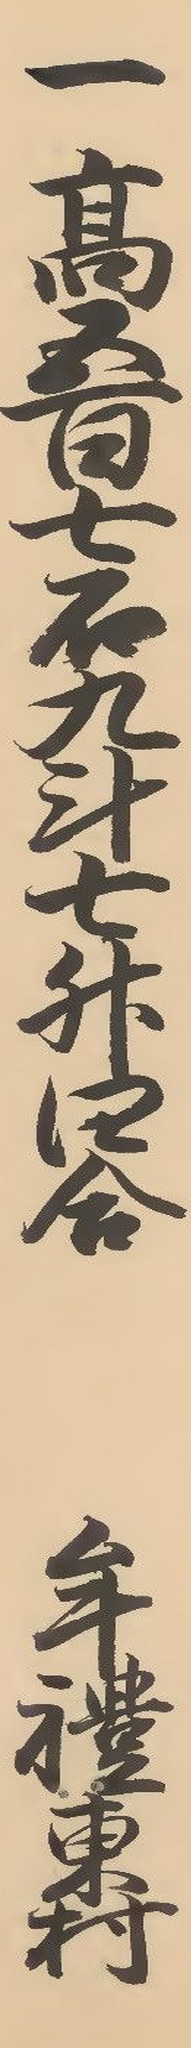一髙五百七石九斗七升四合牟禮東村
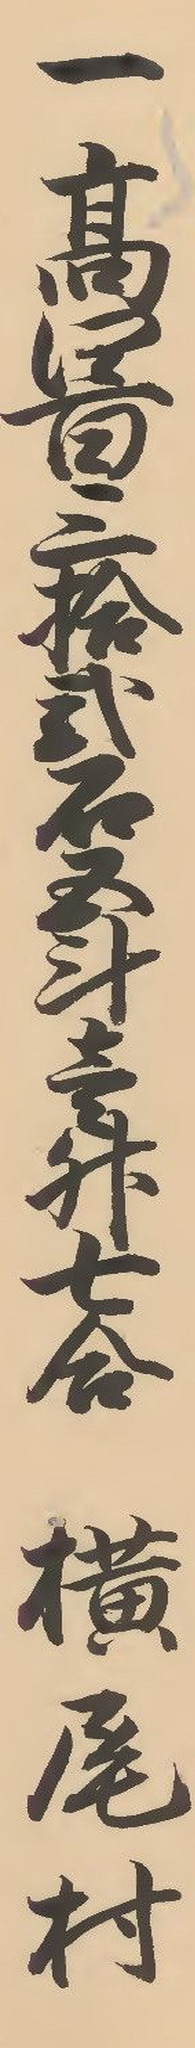一髙四百三拾弐石五斗壱升七合横尾村
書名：播磨国郷帳
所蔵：国立公文書館 National Archives of Japan
